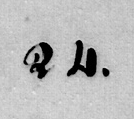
24.
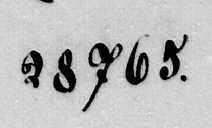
28765.
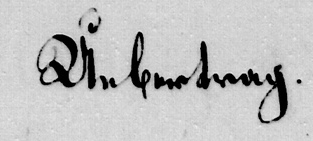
Uebertrag:
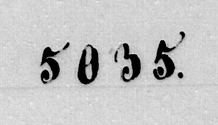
5035.
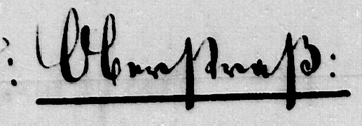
Oberstraß:
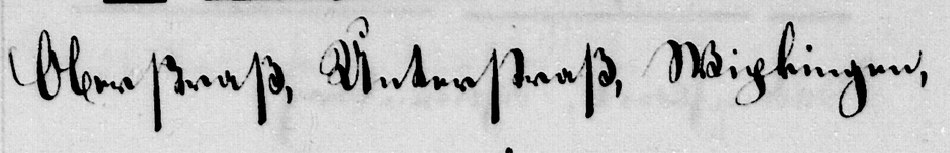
Oberstraß, Unterstraß, Wipkingen,
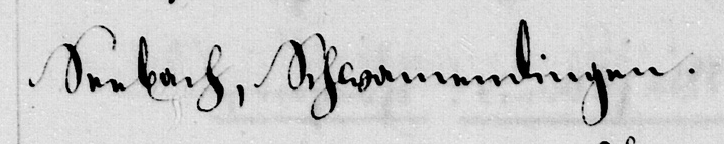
Seebach, Schwamendingen.
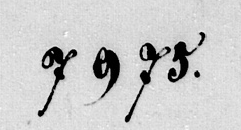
7975.
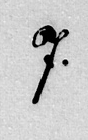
7.
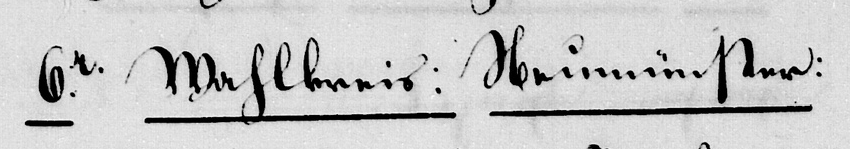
6.r. Wahlkreis: Neumünster:
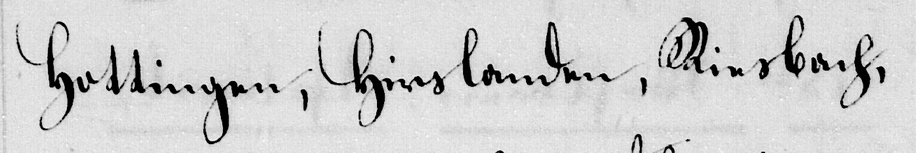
Hottingen, Hirslanden, Riesbach,
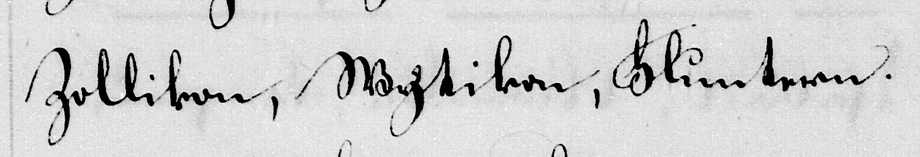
Zollikon, Wytikon, Fluntern.
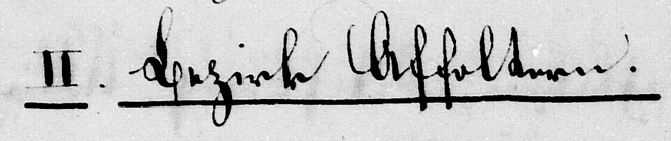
II. Bezirk Affoltern.
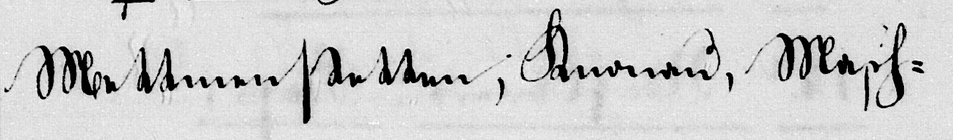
Metmenstetten, Knonau, Masch¬
